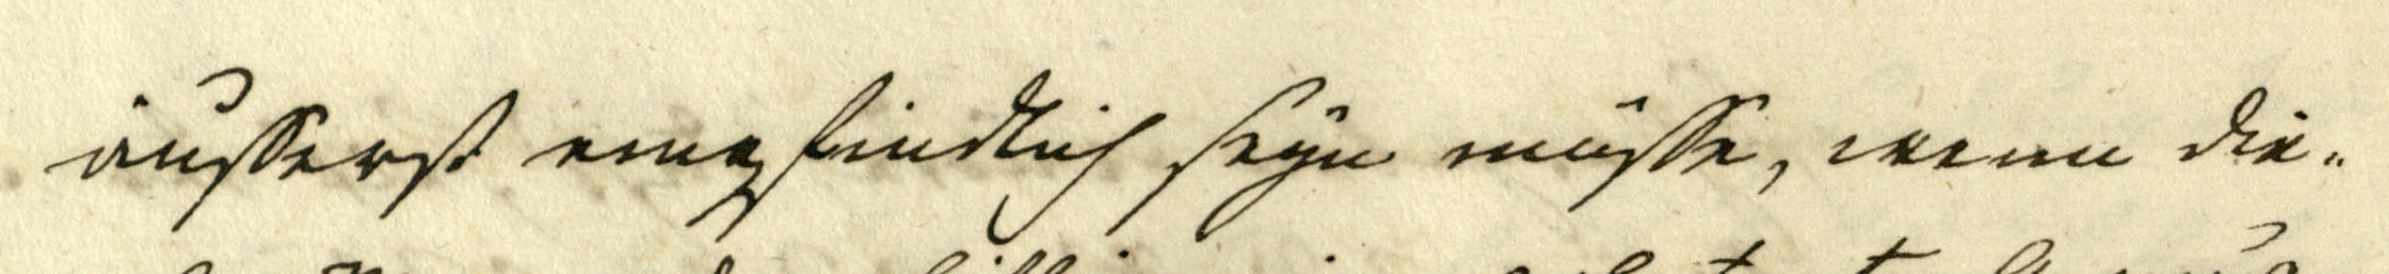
äusserst empfindlich seÿn müsse, wenn die¬
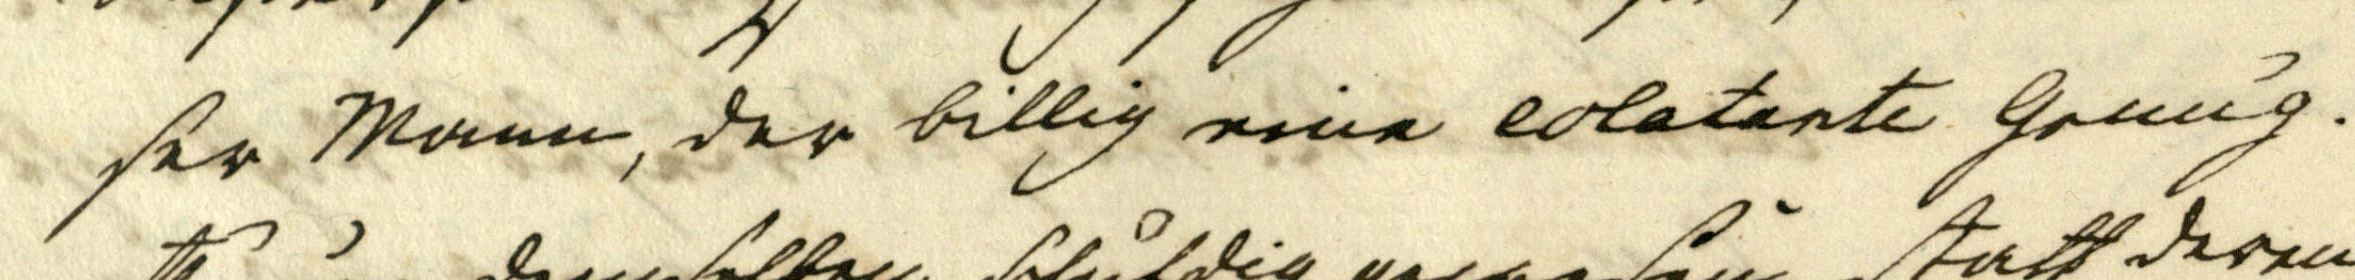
ser Mann, der billig eine eclatante Genug¬
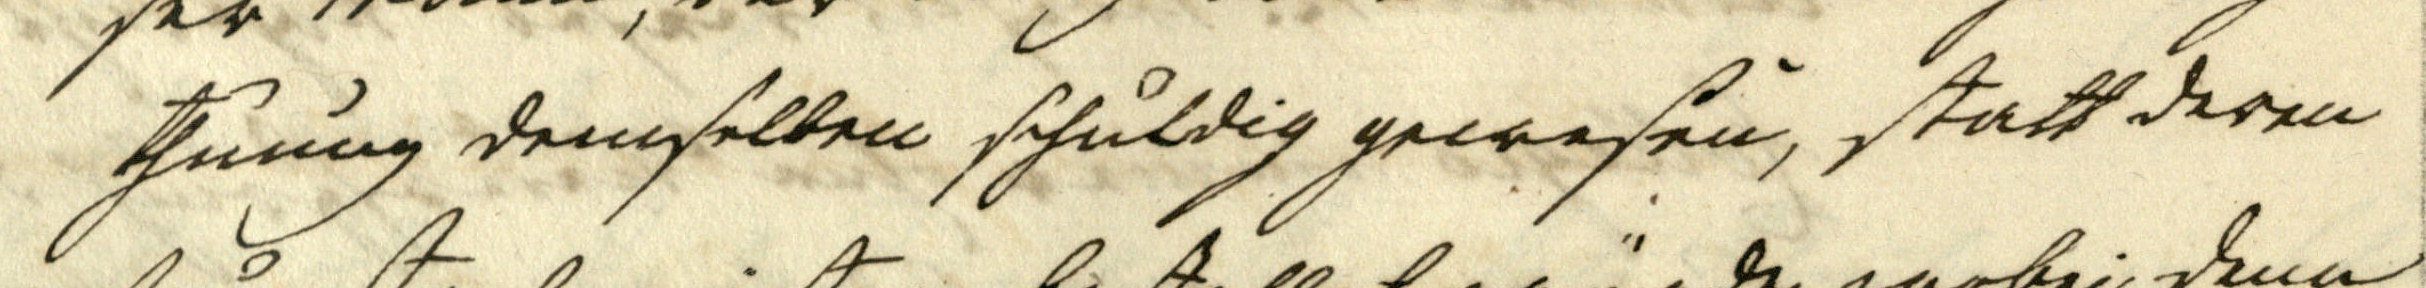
thuung demselben schuldig gewesen, statt deren
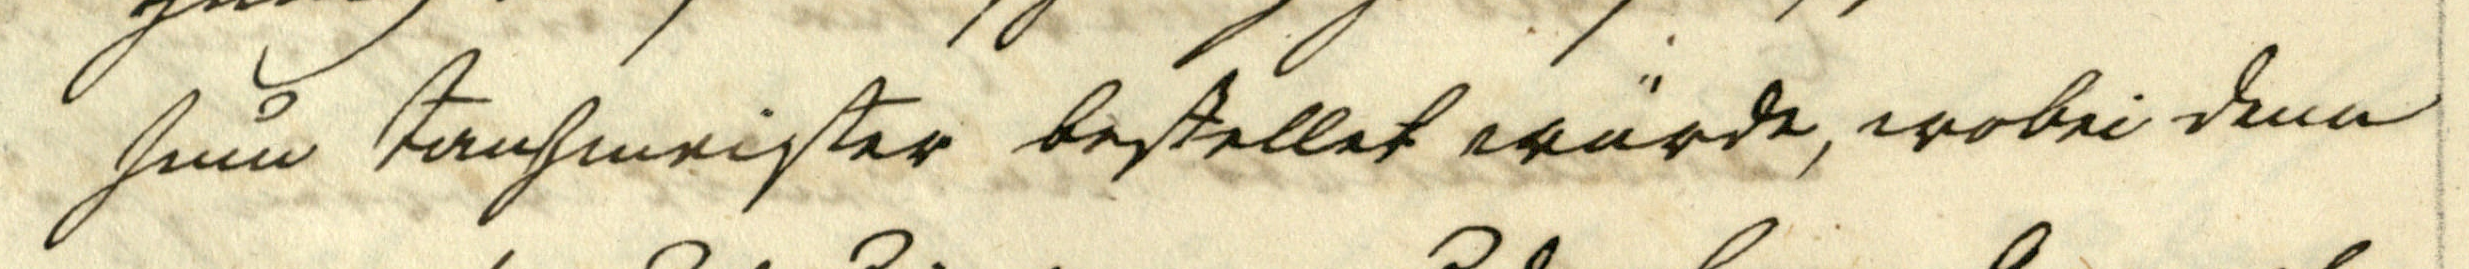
zum Tanzmeister bestellet würde, wobei denn
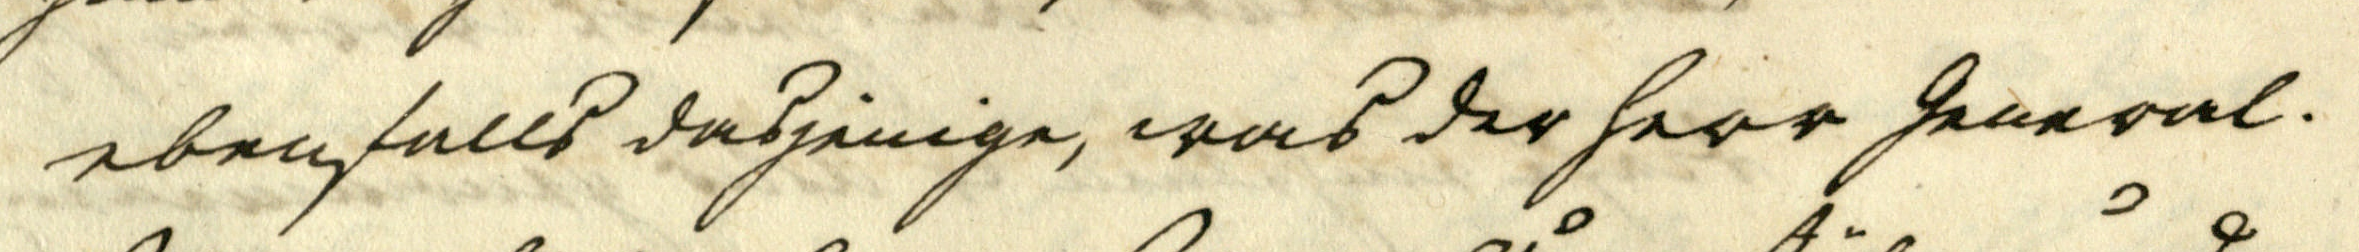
ebenfalls dasjenige, was der Herr General¬
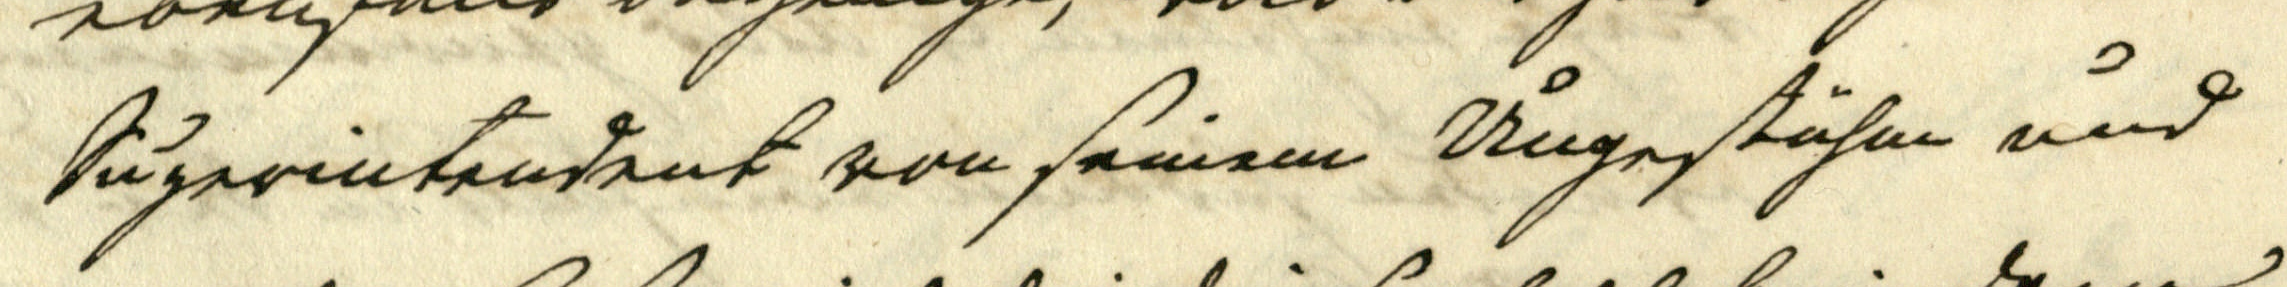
Superintendent von seinem Ungestühm und
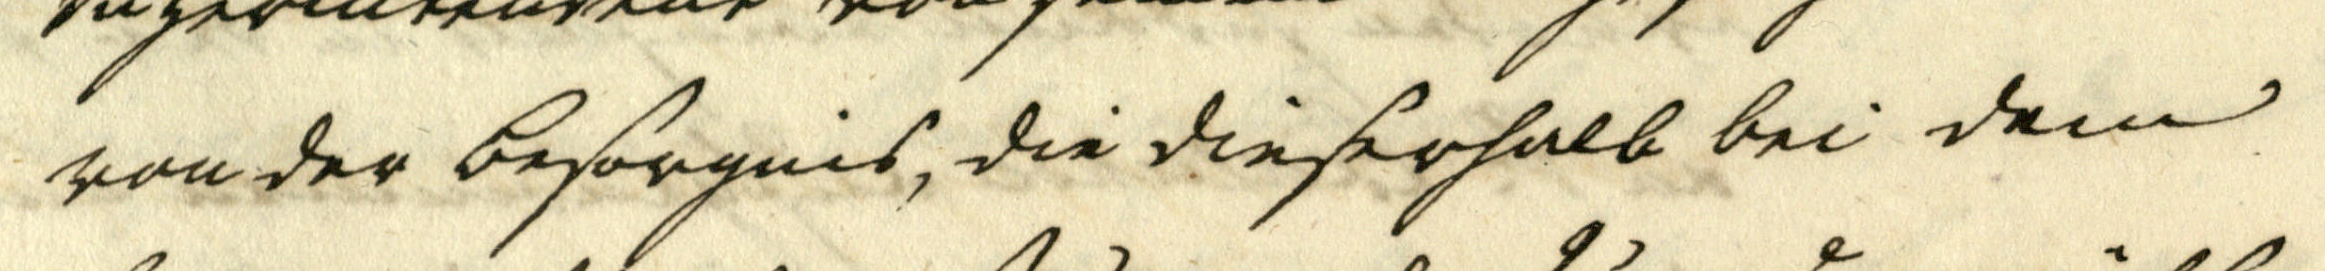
von der Besorgnis, die dieserhalb bei dem
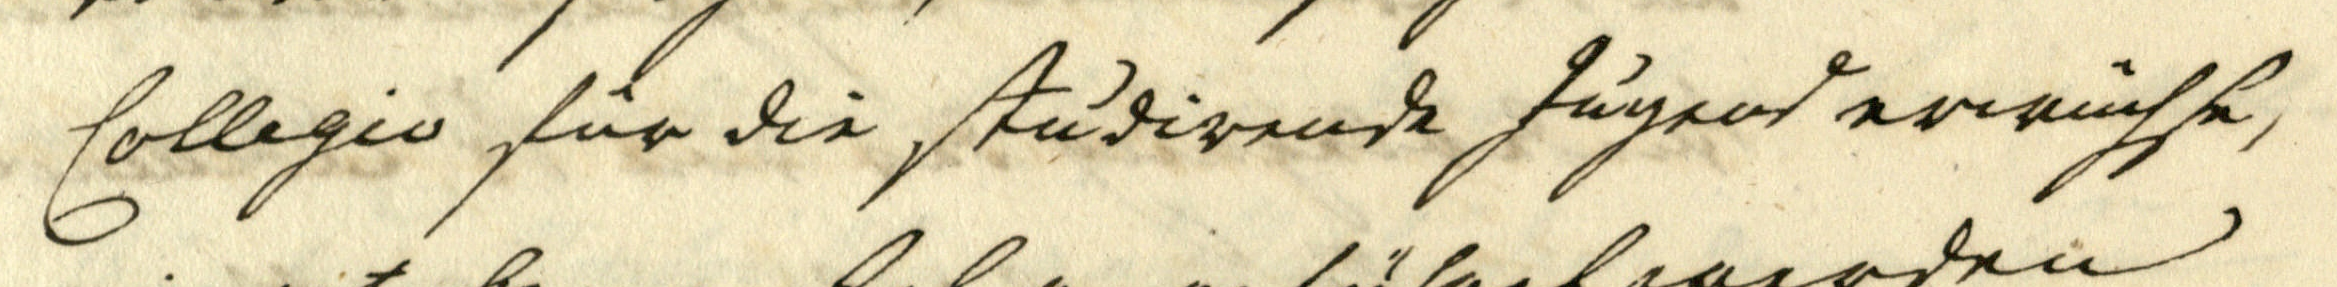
Collegio für die studirende Jugend erwüchse,
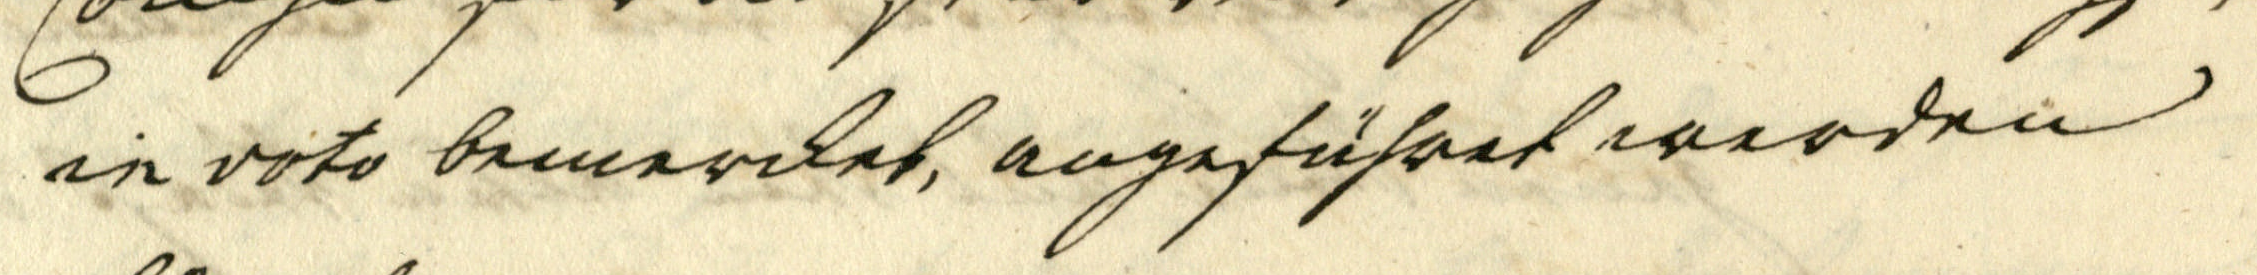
in voto bemercket, angeführet werden
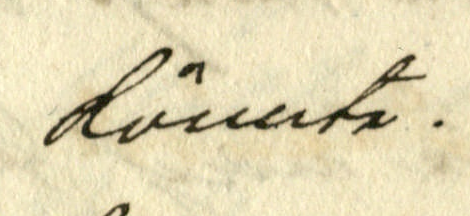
könnte.
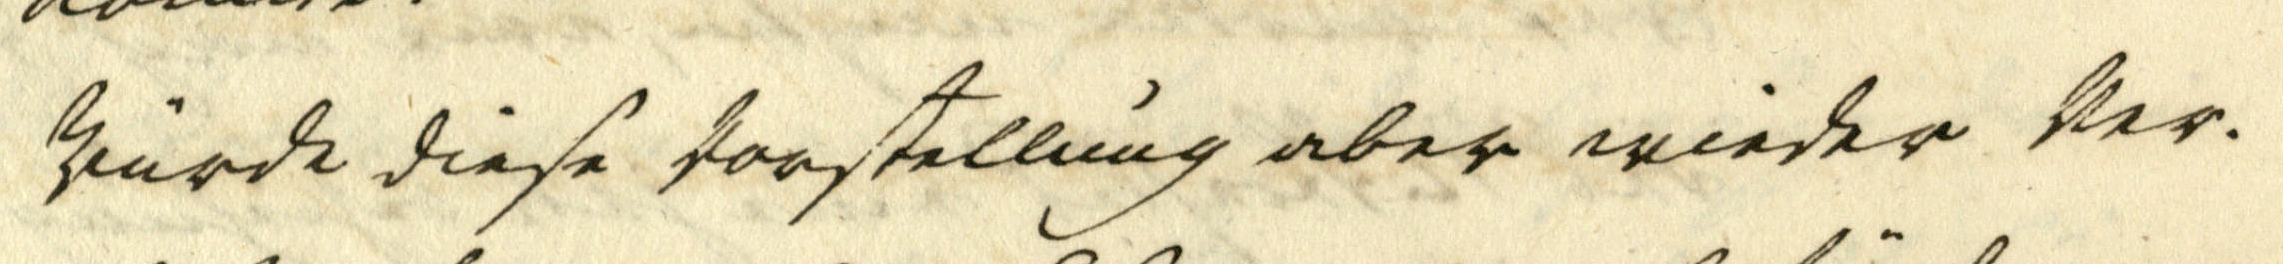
Würde diese Vorstellung aber wieder Ver¬
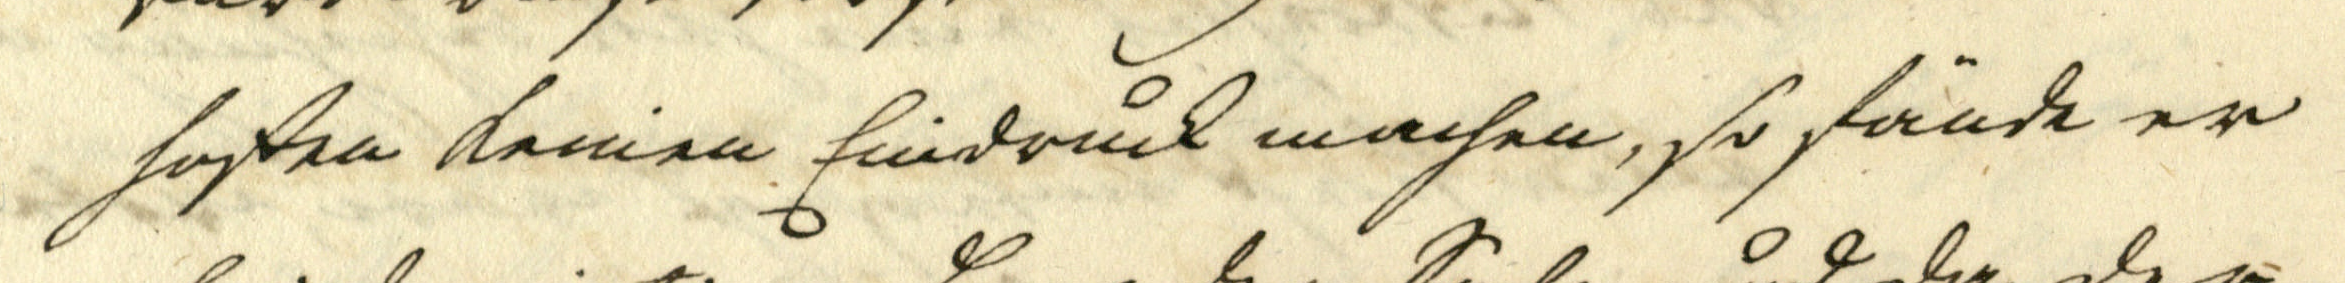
hoffen keinen Eindruck machen, so fände er
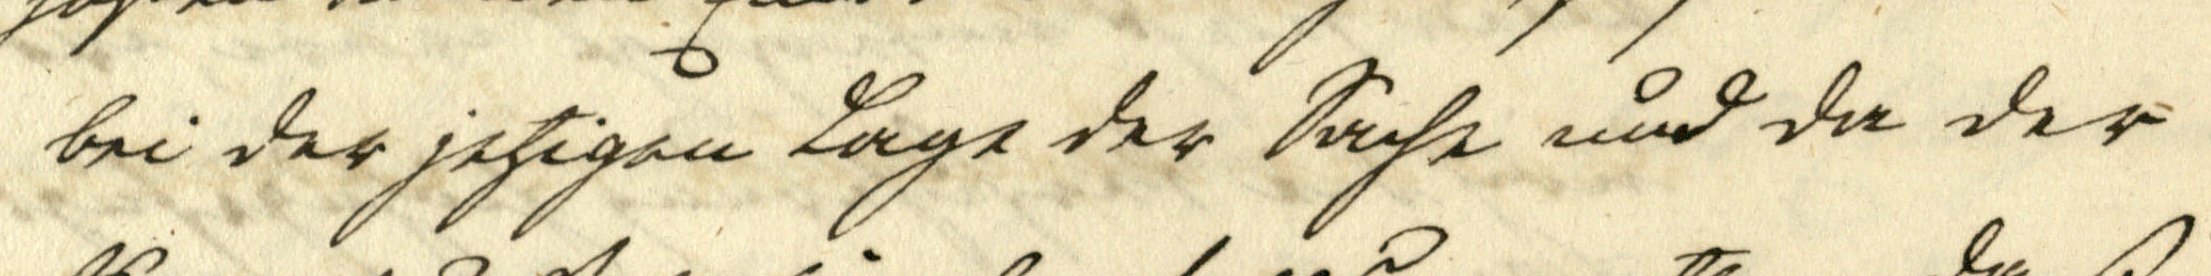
bei der jetzigen Lage der Sache und da der
